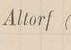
Altorf
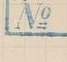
1875
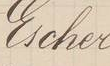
du Comité de
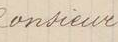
Direction
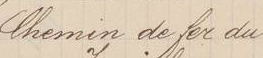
Chemin de fer du
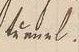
Gothard,
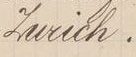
Zurich.
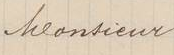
Monsieur
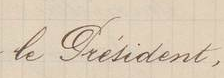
le Président,
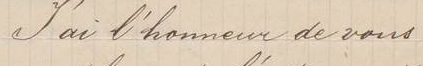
J'ai l'honneur de vous
